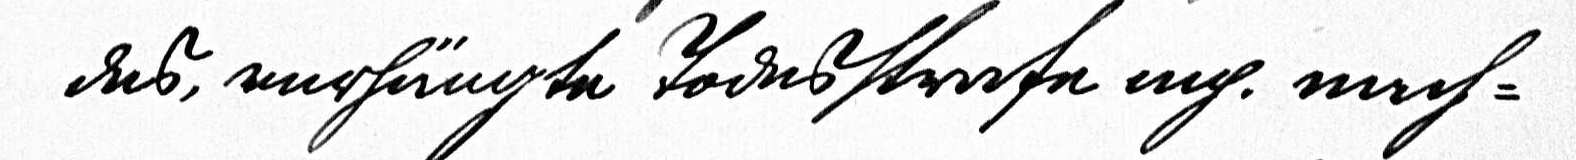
des, verhängte Todesstrafe ag. Nach¬
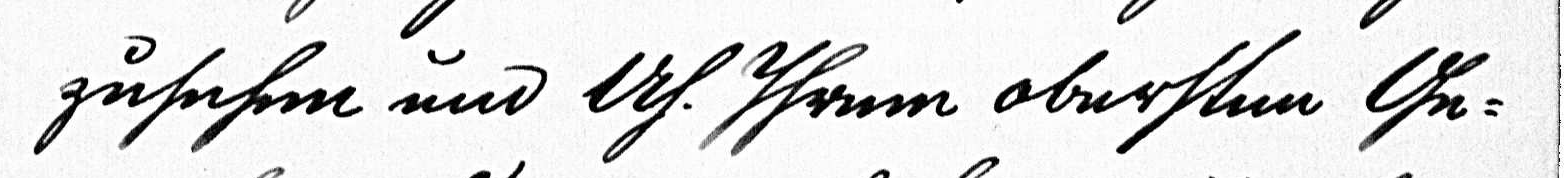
zusehen und Ah. Ihrem obersten Ge¬
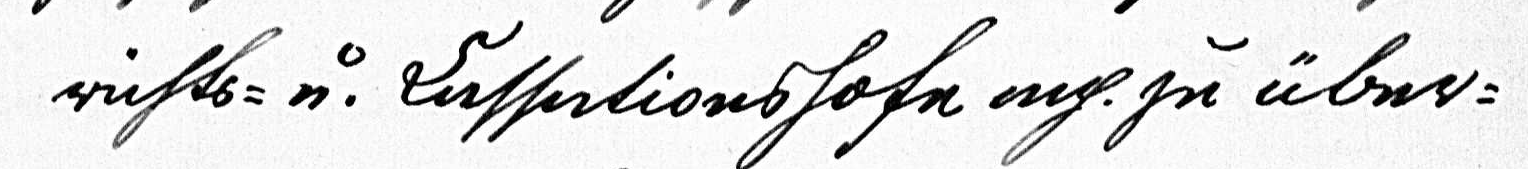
richts- u. Cassationshofe ag zu über¬
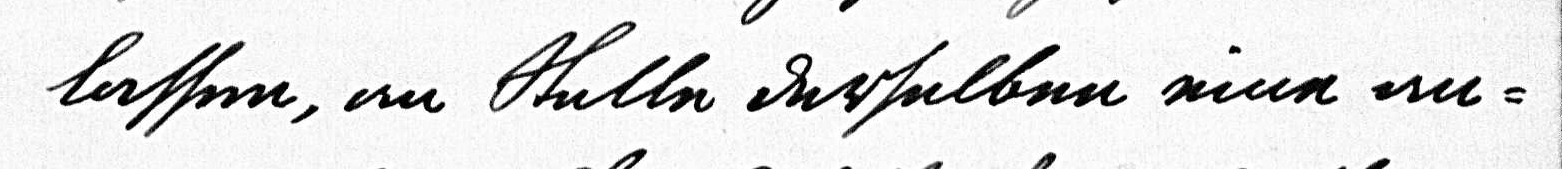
lassen, an Stelle derselben eine an¬
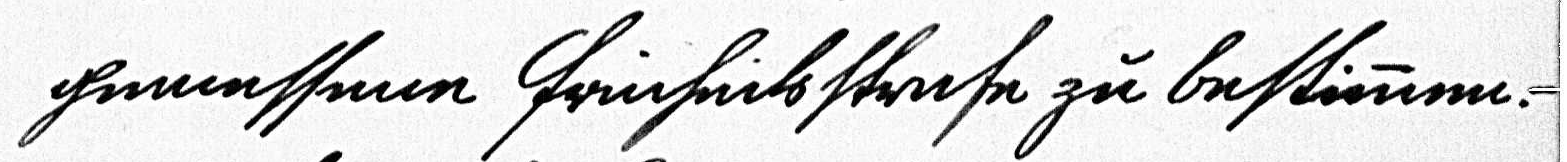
gemessene Freiheitsstrafe zu bestimmen.
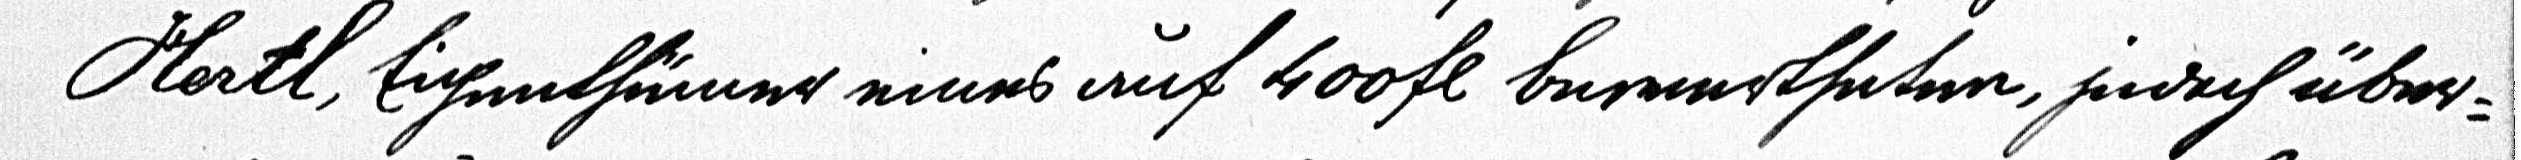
Hertl, Eigenthümer eines auf 400fl bewertheten, jedoch über¬
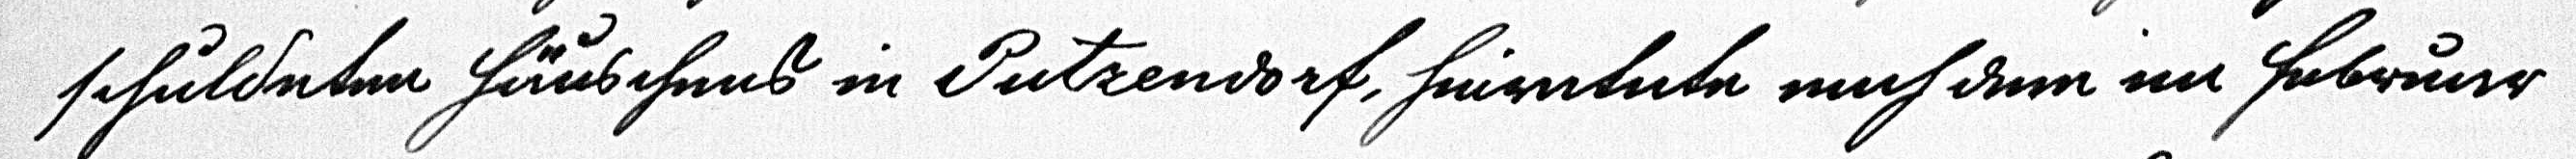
schuldeten Häuschens in Putzendorf, heiratete nach dem im Februar
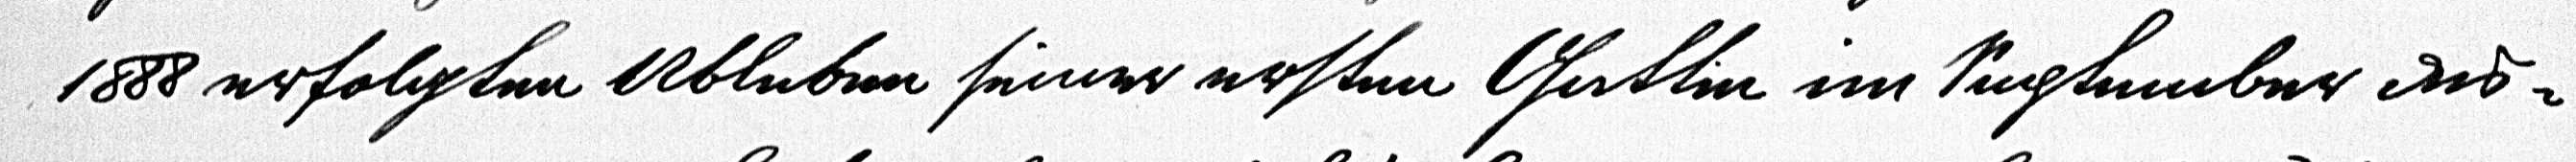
1888 erfolgten Ableben seiner ersten Gattin im September des¬
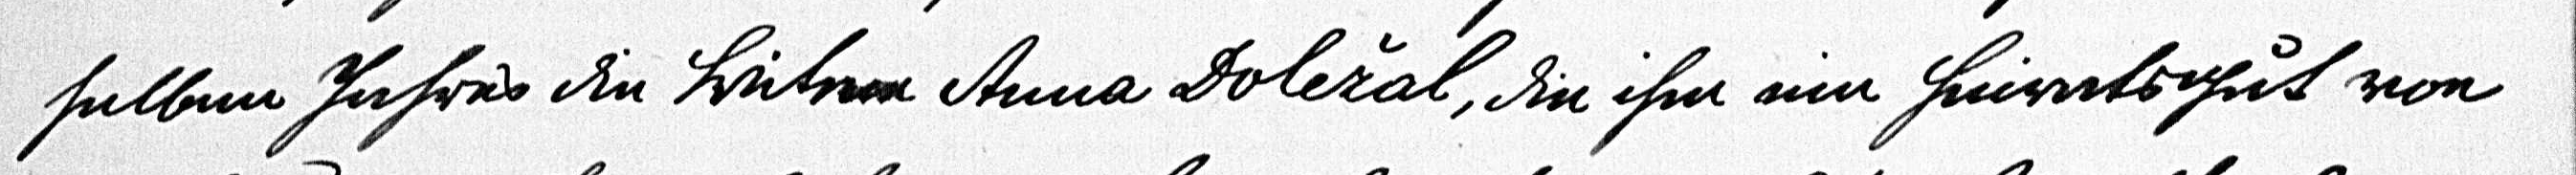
selben Jahres die Witwe Anna Doležal, die ihm ein Heiratsgut von
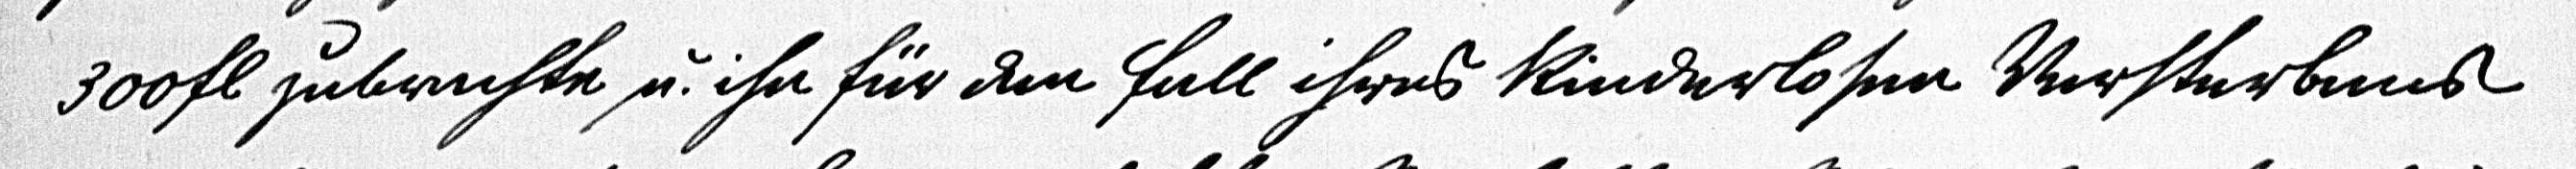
300fl zubrachte u. ihn für den Fall ihres Kinderlosen Versterbens
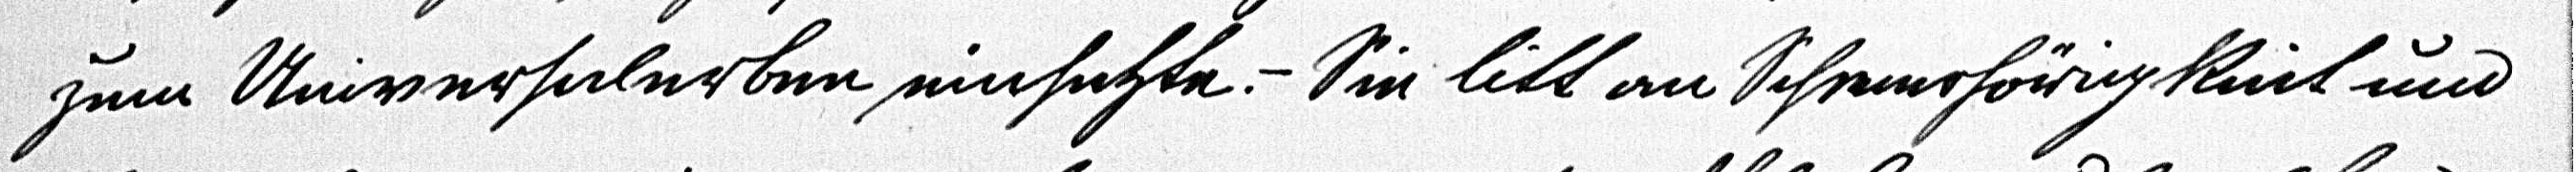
zum Universalerben einsetzte. Sie litt an Schwerhörigkeit und
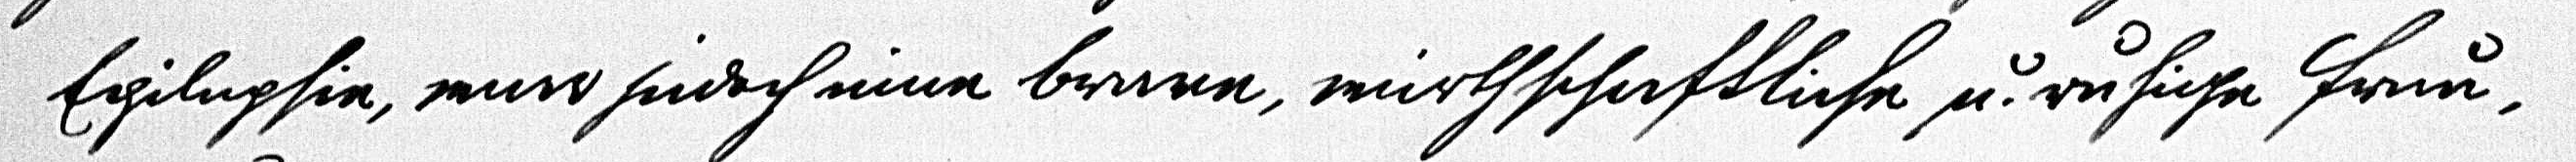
Epilepsie, war jedoch eine brave, wirthschaftliche u. ruhige Frau,
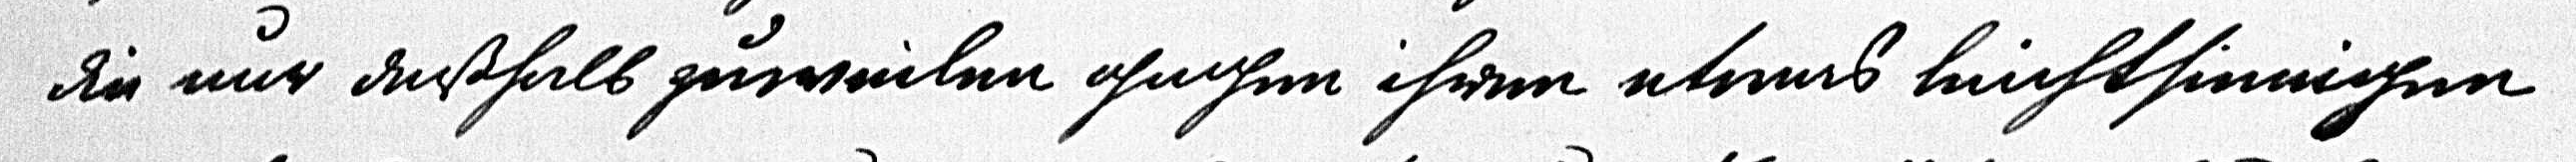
die nur deßhalb zuweilen gegen ihren etwas leichtsinnigen
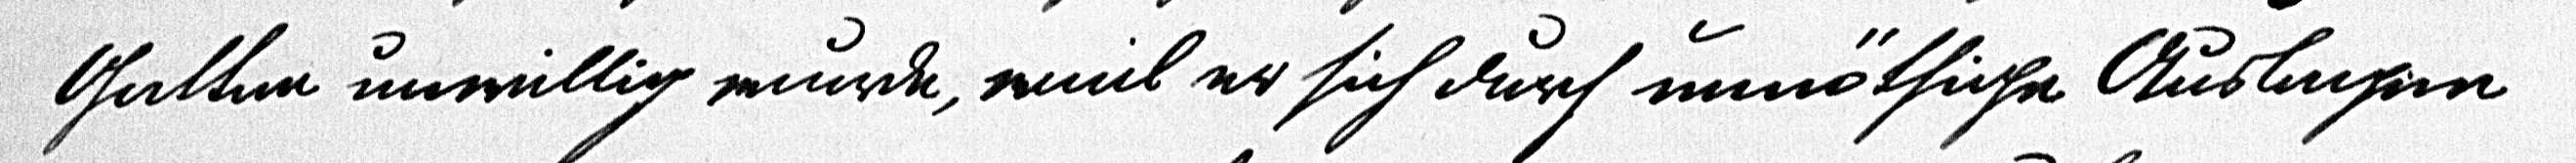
Gatten unwillig wurde, weil er sich durch unnöthige Auslegen
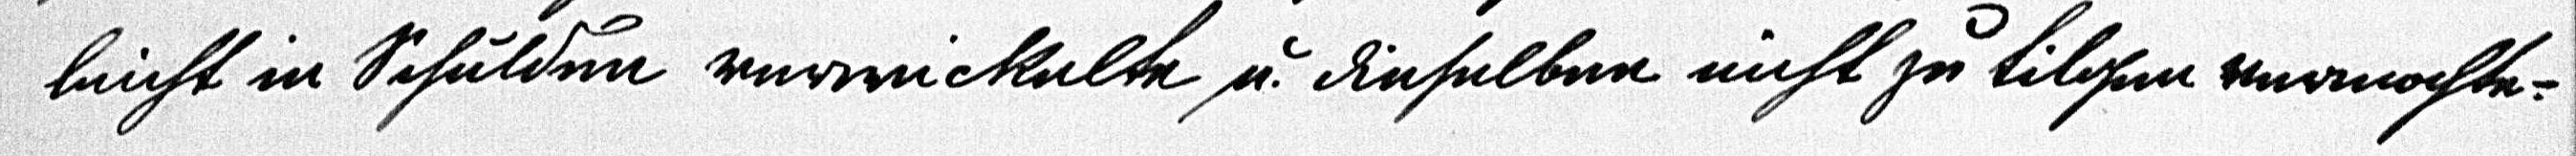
leicht in Schulden verwickelte u dieselben nicht zu tilgen vermochte.
